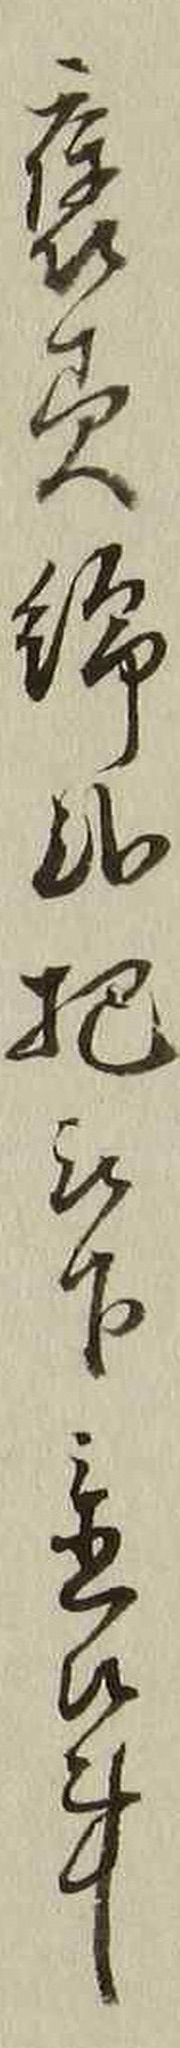褒美綿弐把被下置候事
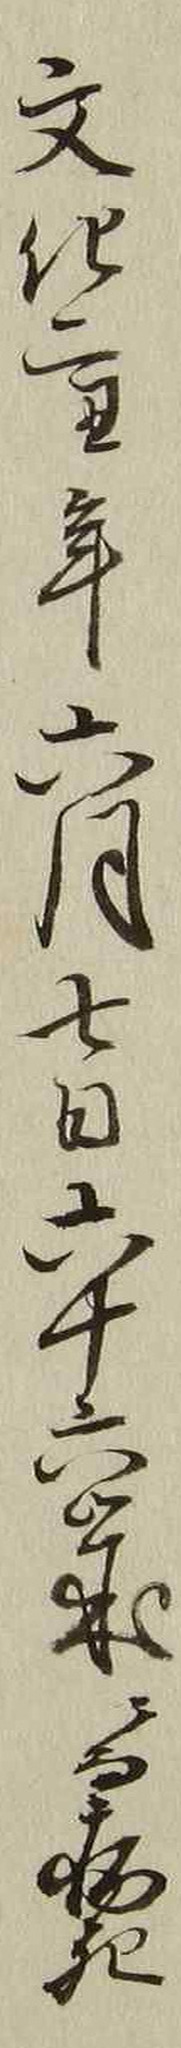文化二丑年六月七日六十六歳ニ而病死
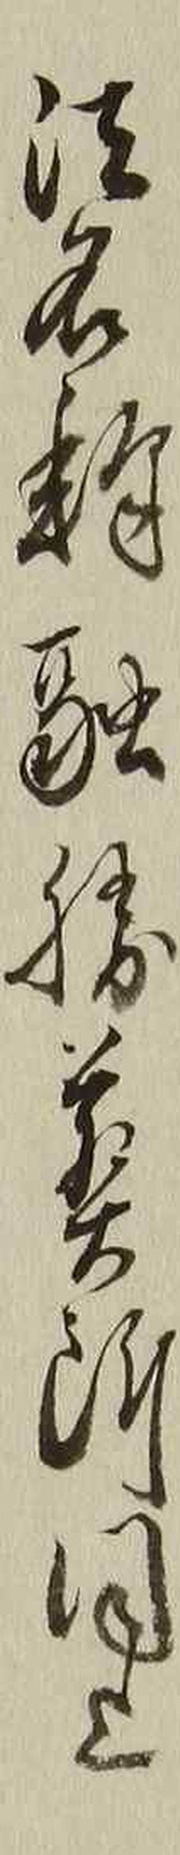法名釈融勝葬所同上
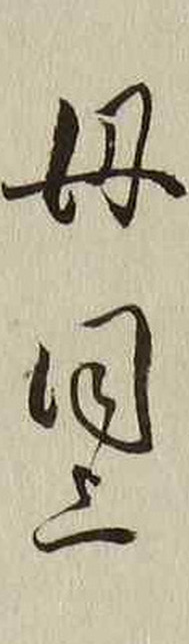母同上
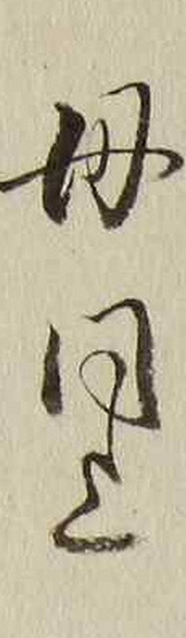母同上
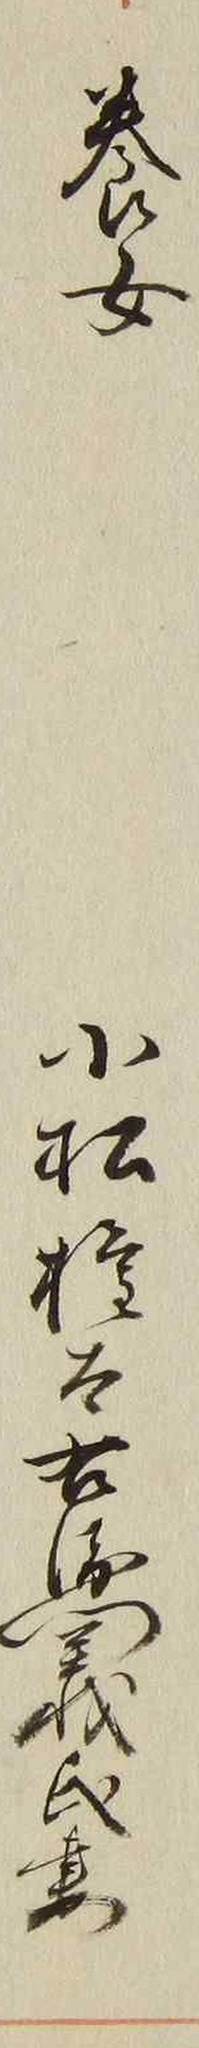養女小松権太右衛門義氏妻
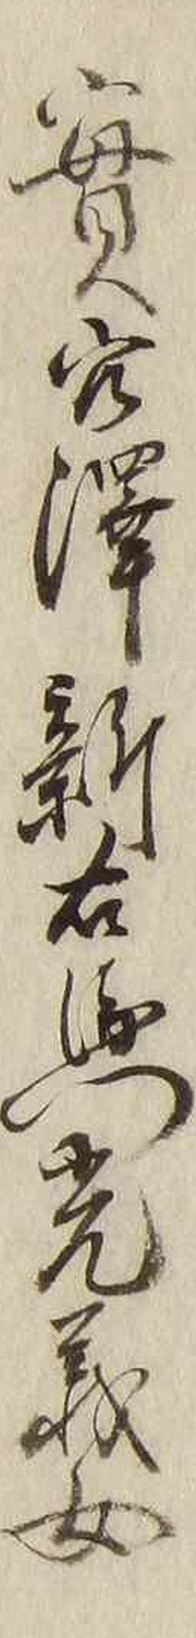実穴澤新右衛門光義女

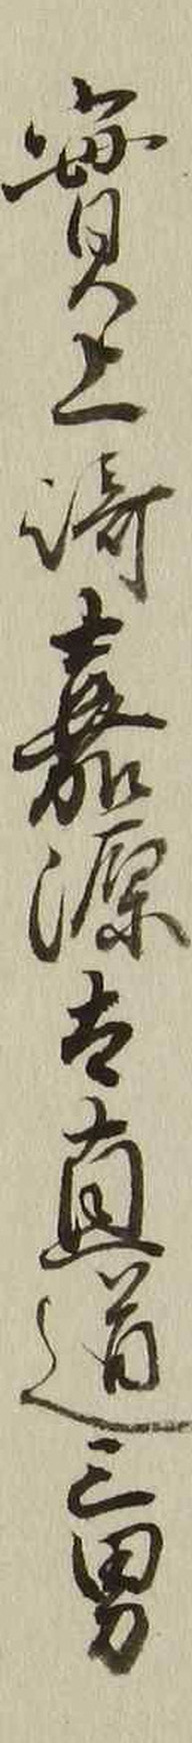実上崎嘉源太直道三男
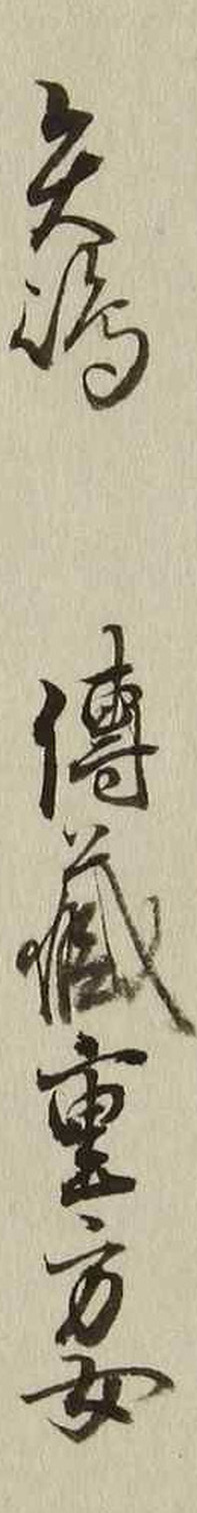矢嶋伝蔵重方女
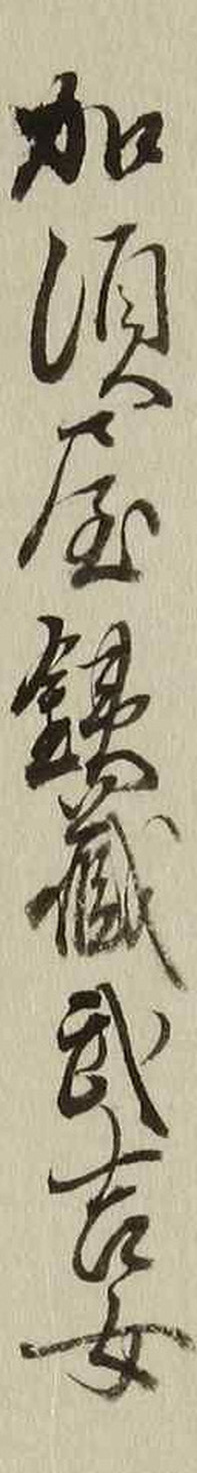加須屋鉄蔵武吉女
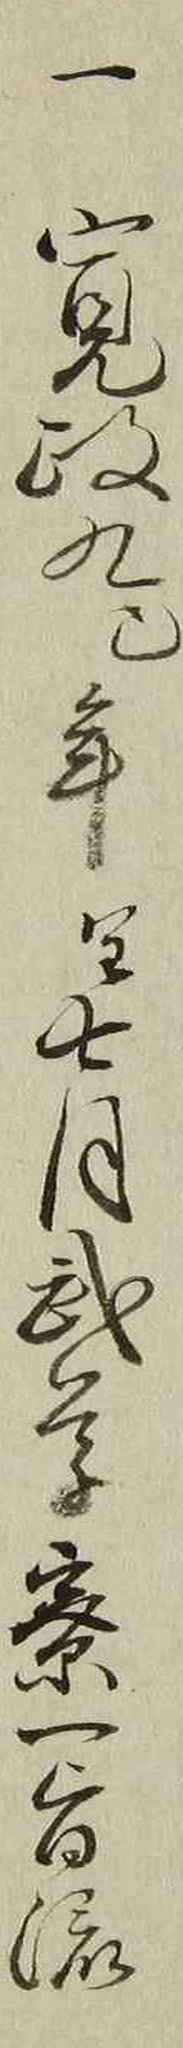一寛政九巳年閏七月武学寮一旨流
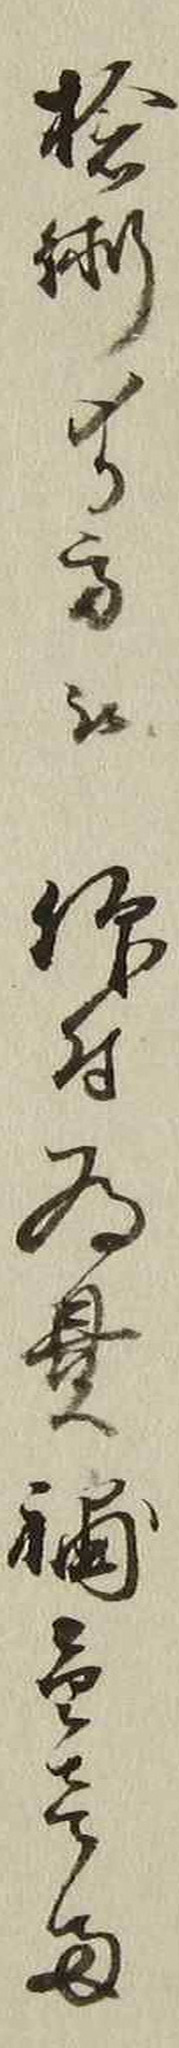槍術〆り方被仰付為費補金壱両
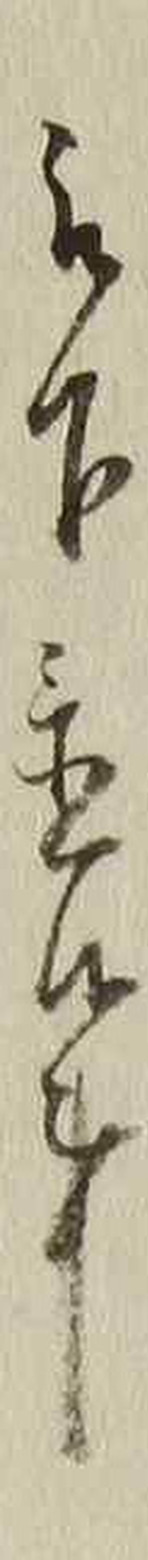被下置候事
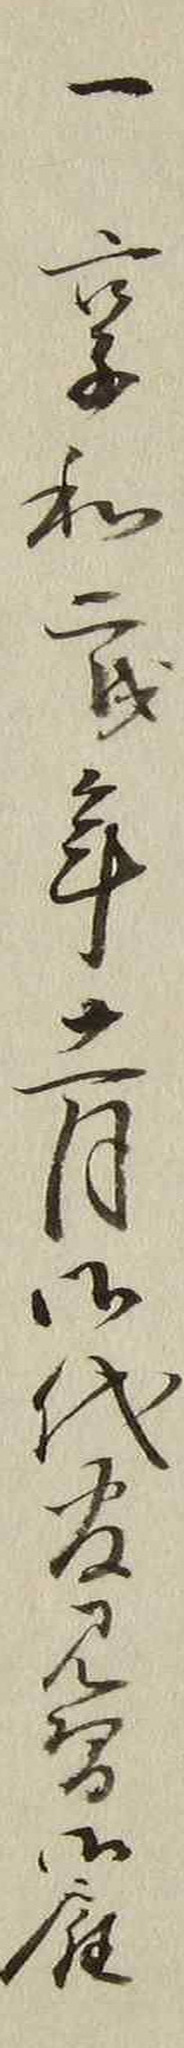一享和二戌年十一月御代官見習御雇
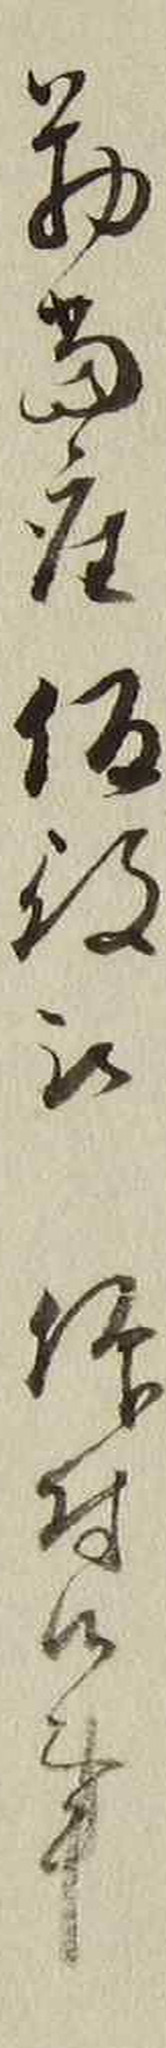勤当座仮役被仰付候事
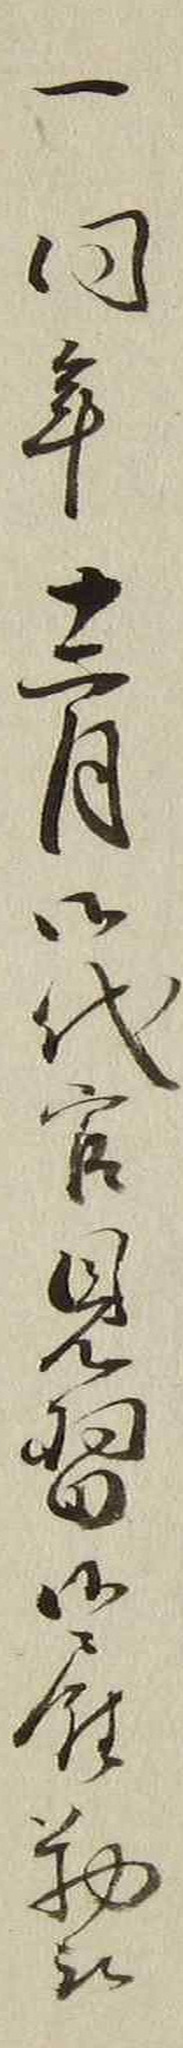一同年十二月御代官見習御雇勤被
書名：諸士系譜　巻之129　た之部5
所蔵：会津若松市立会津図書館
